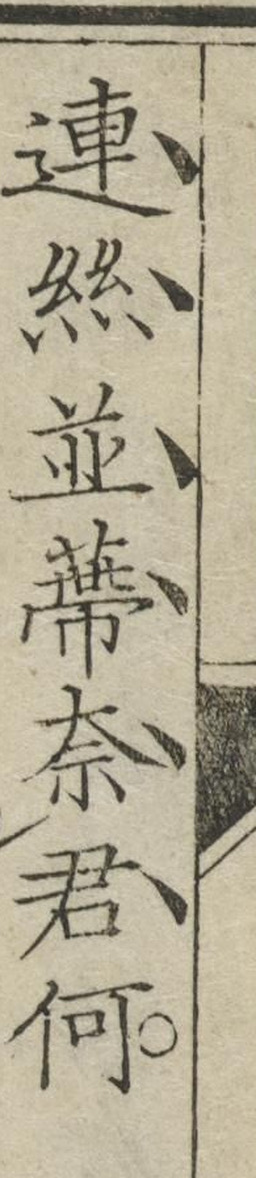連糸並帯奈君何
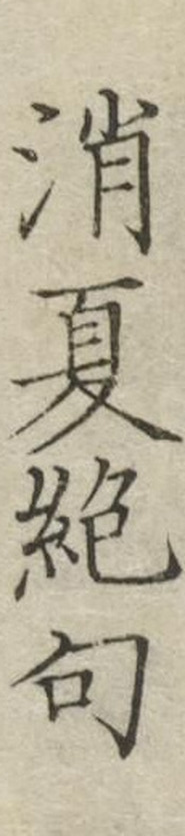消夏絶句
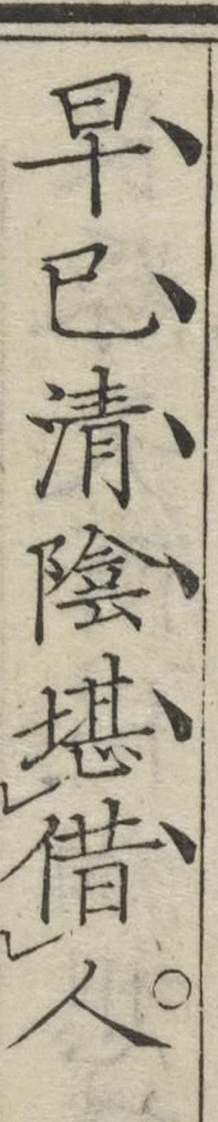早已清陰堪借人
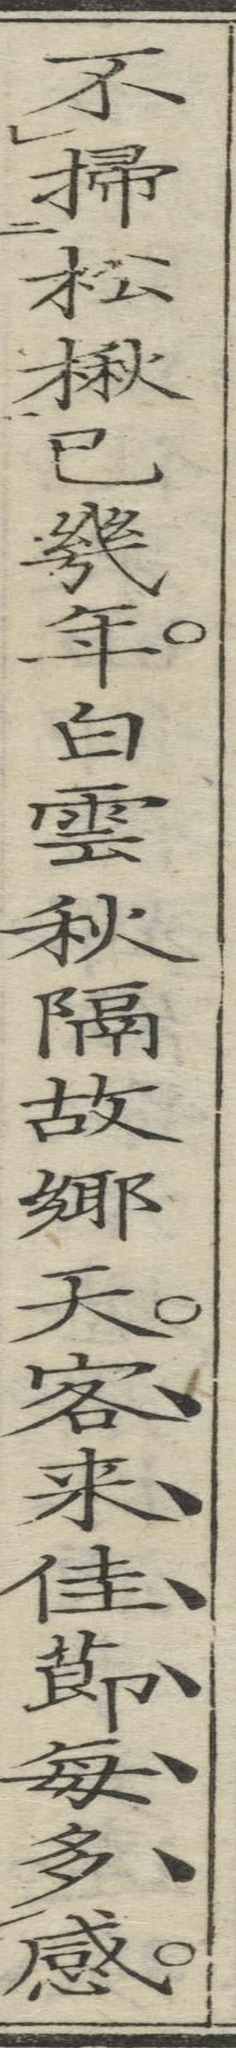不掃松楸已幾年白雲秋隔故郷天客来佳節毎多感
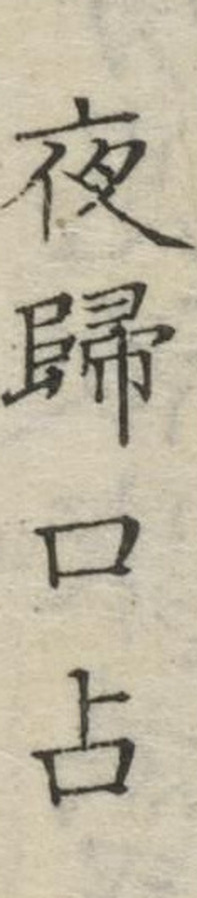夜帰口占
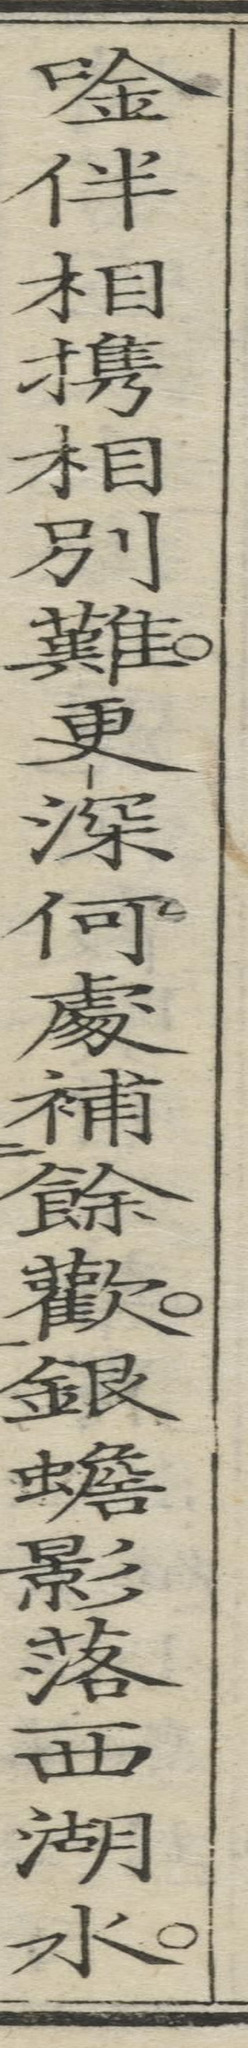唫伴相携相別難更-深何処補餘歓銀蟾影落西湖水
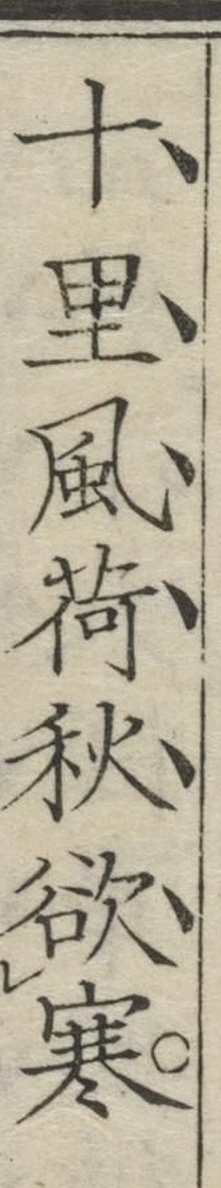十里風荷秋欲寒
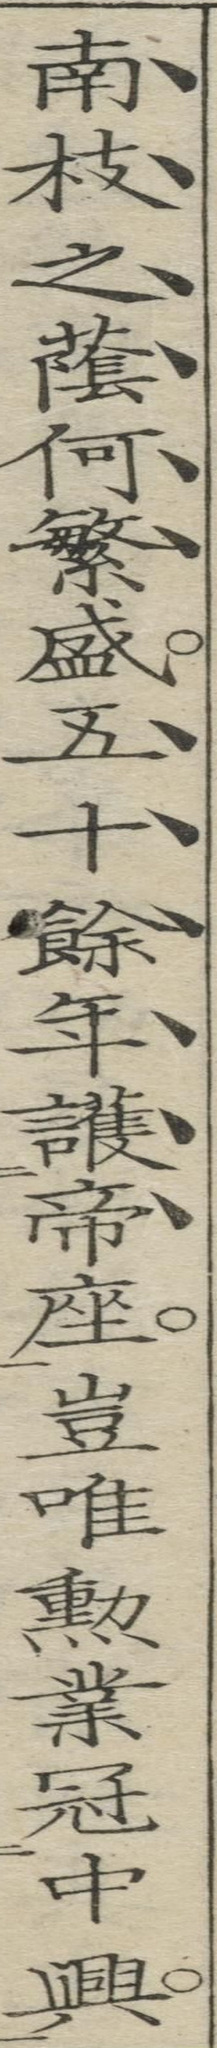南枝之蔭何繁盛五十餘年護帝座豈唯勲業冠中興
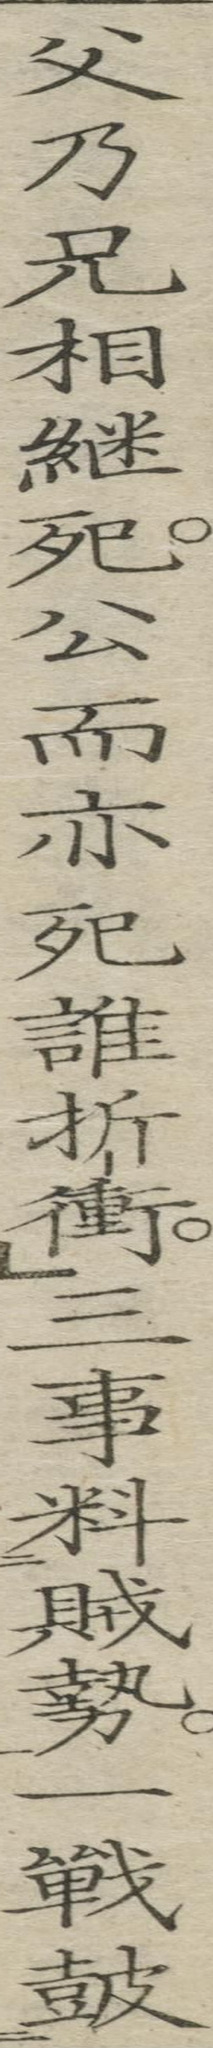父乃兄相継死公而亦死誰折-衝」三事料賊勢一戦鼓
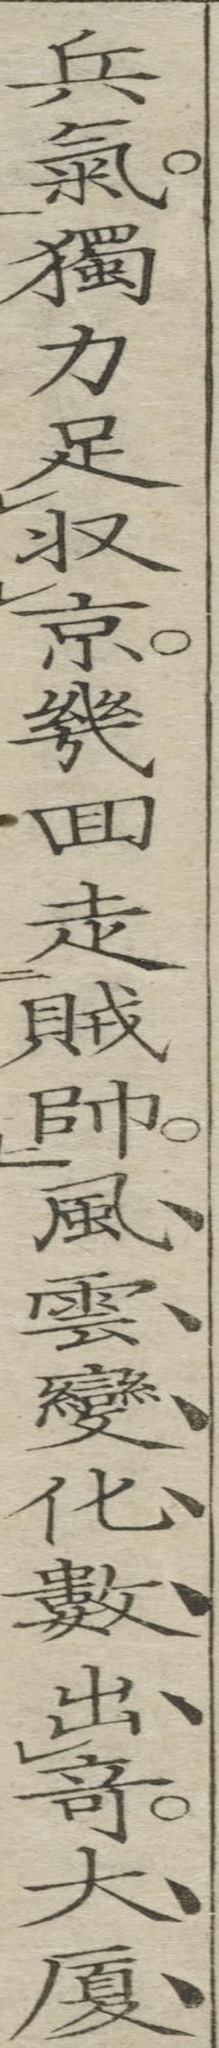兵気独力足収京幾回走賊師」風雲変化数出奇大厦
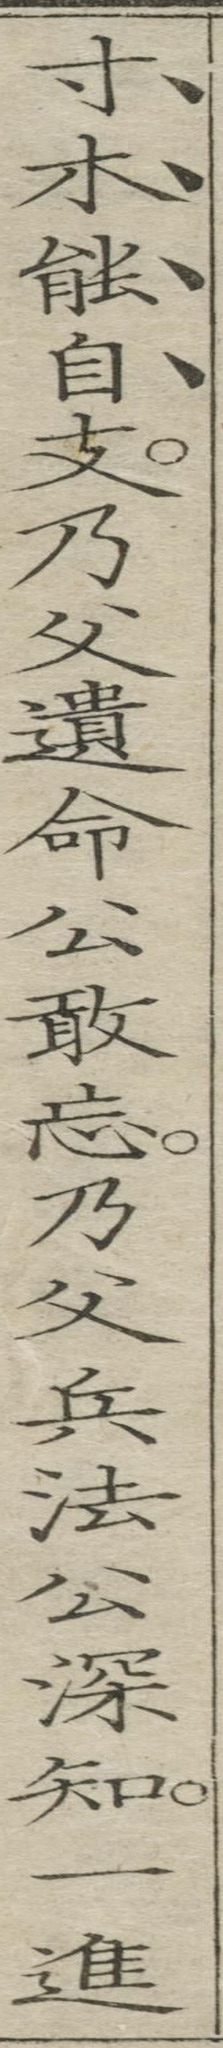寸木能自支乃父遺命公敢忘乃父兵法公深知一進
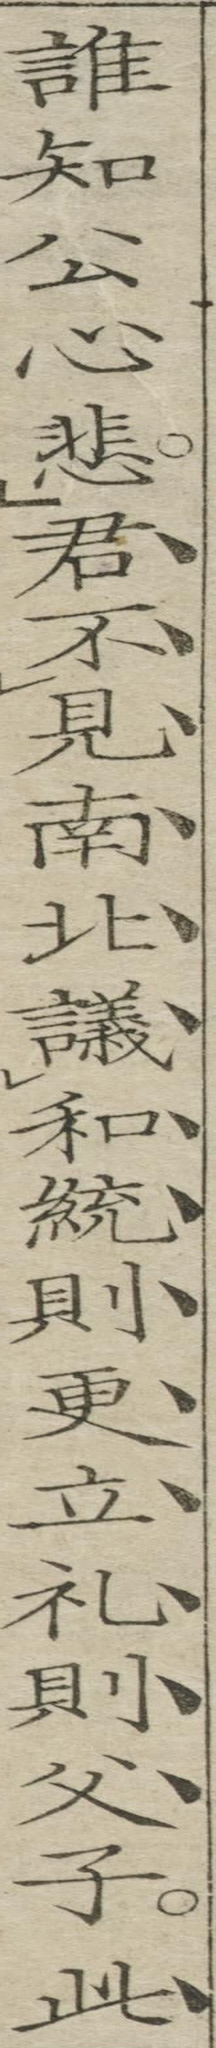誰知公心悲」君不見南北議和統則更立礼則父子此
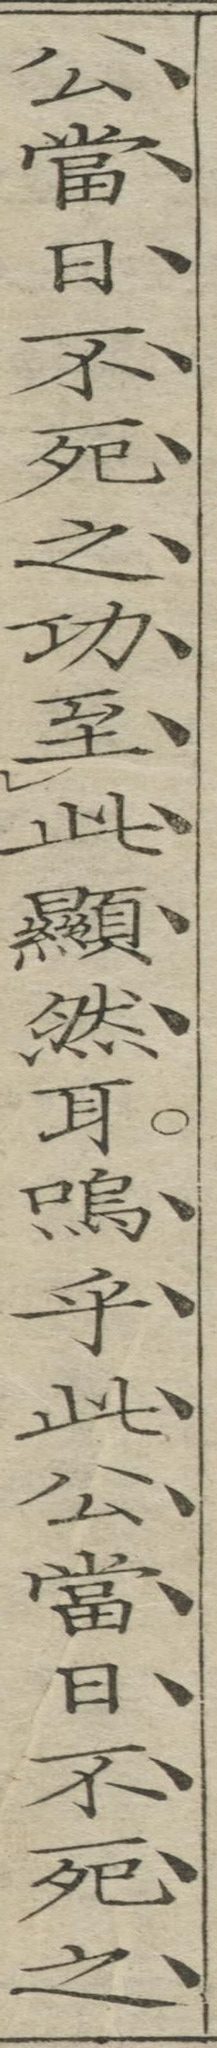公当日不死之功至此顕然耳嗚呼此公当日不死之

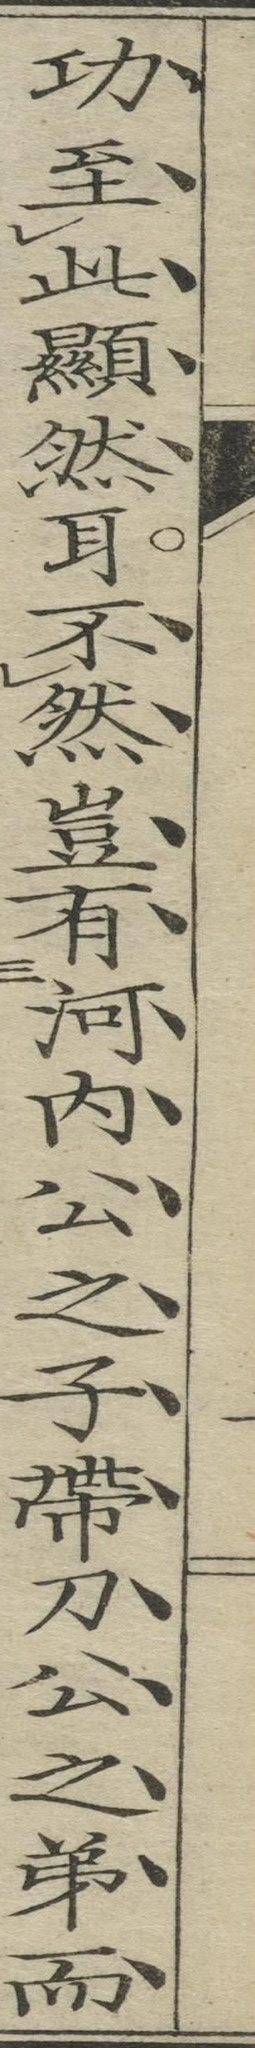功至此顕然耳不然豈有河内公之子帯刀公之弟而
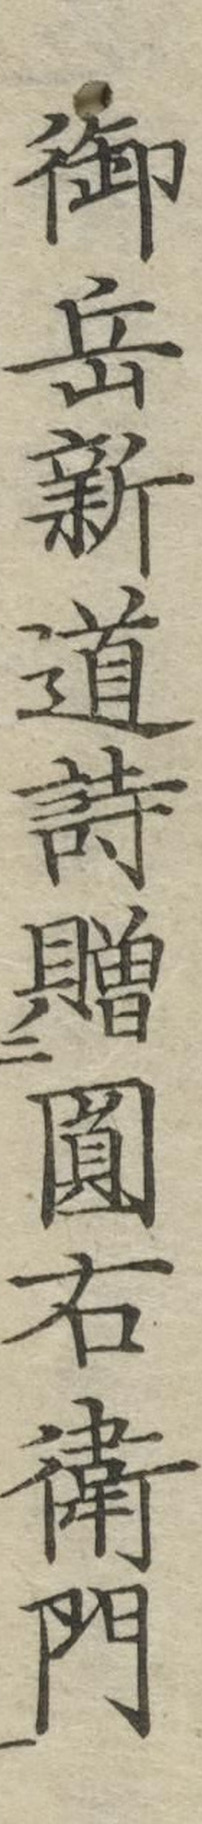御岳新道詩贈圓右衛門
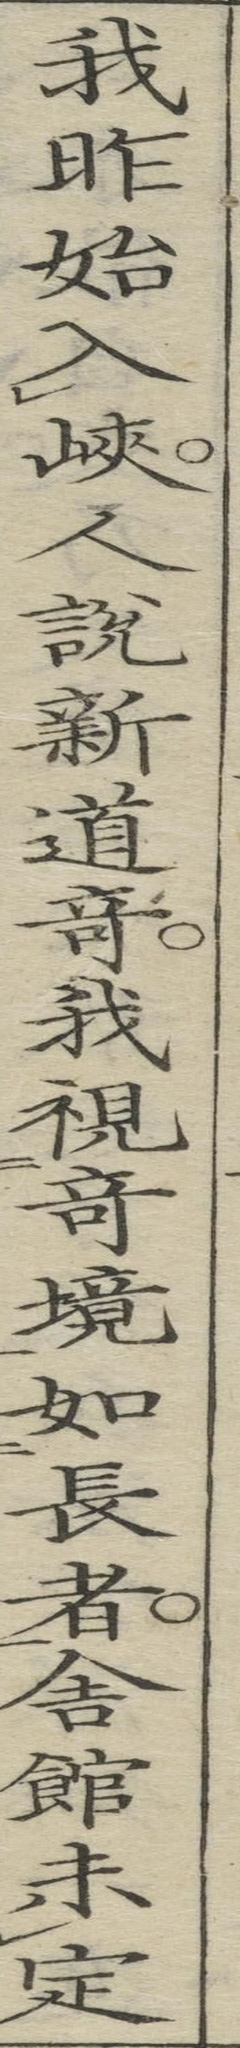我昨始入峡人説新道奇我視奇境如長者舎館未定
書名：火後憶得詩
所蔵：東京大学地震研究所図書室 Earthquake Research Institute Library, The University of Tokyo, JAPAN
